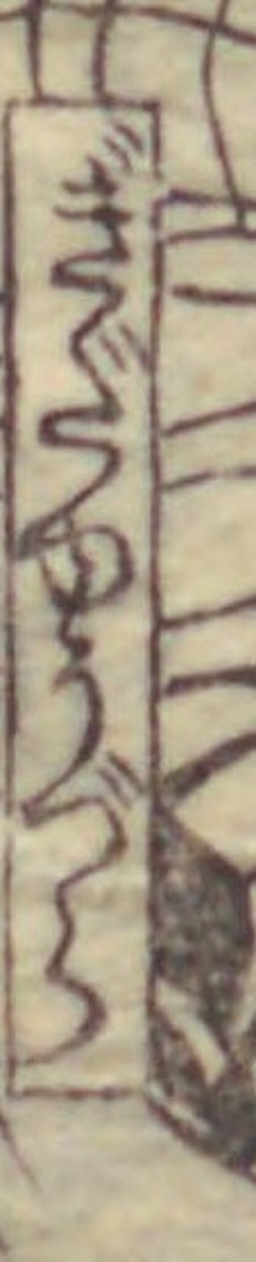ぎだゆうづら
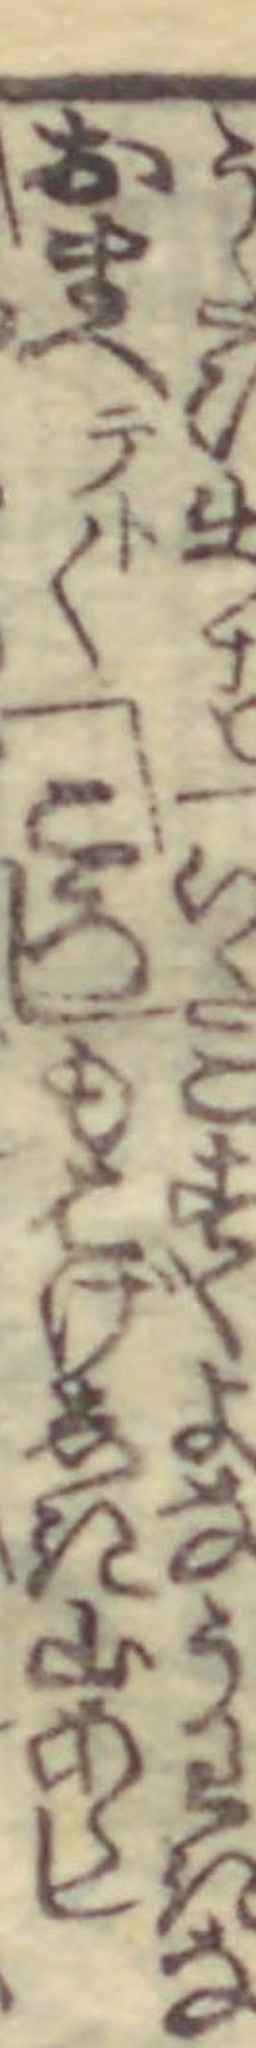うまへテト〳〵〽ころしもはげしき山あらし
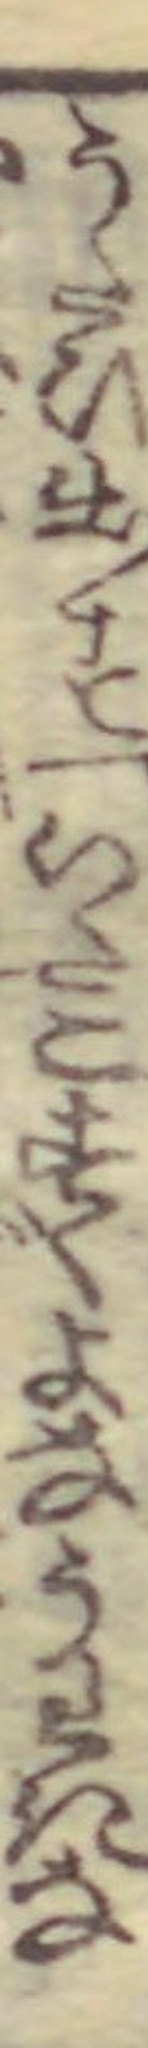うたひ出す〽いたこすくよなうわきな
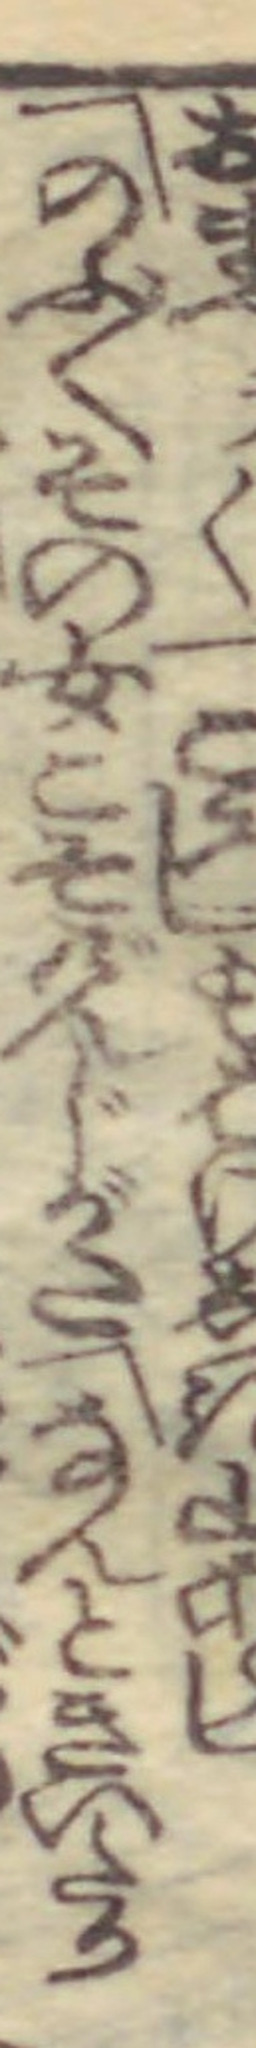〽のふ〳〵その女こそげんじがた〽なんときいたり
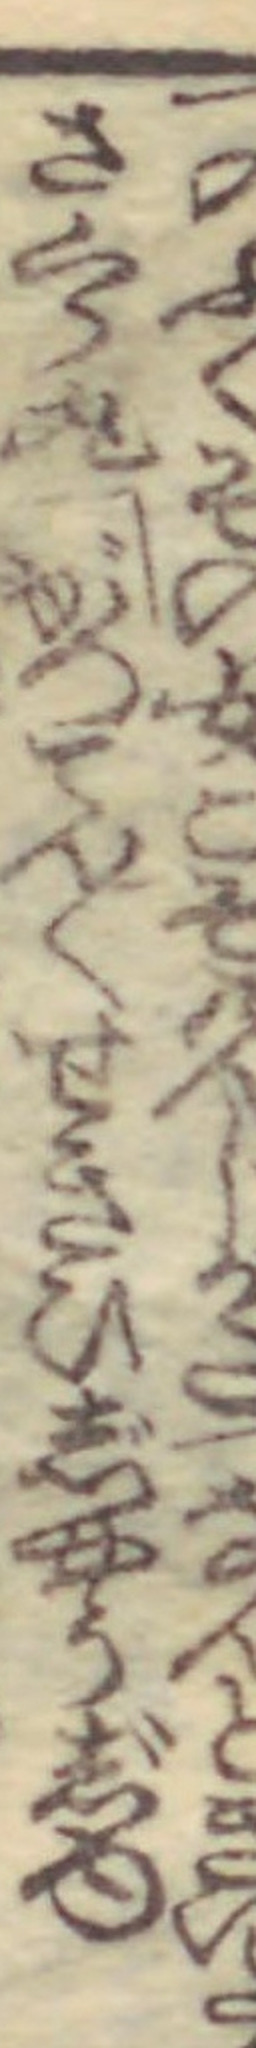さくら丸〽がつてん〳〵せきひじやうじゆ
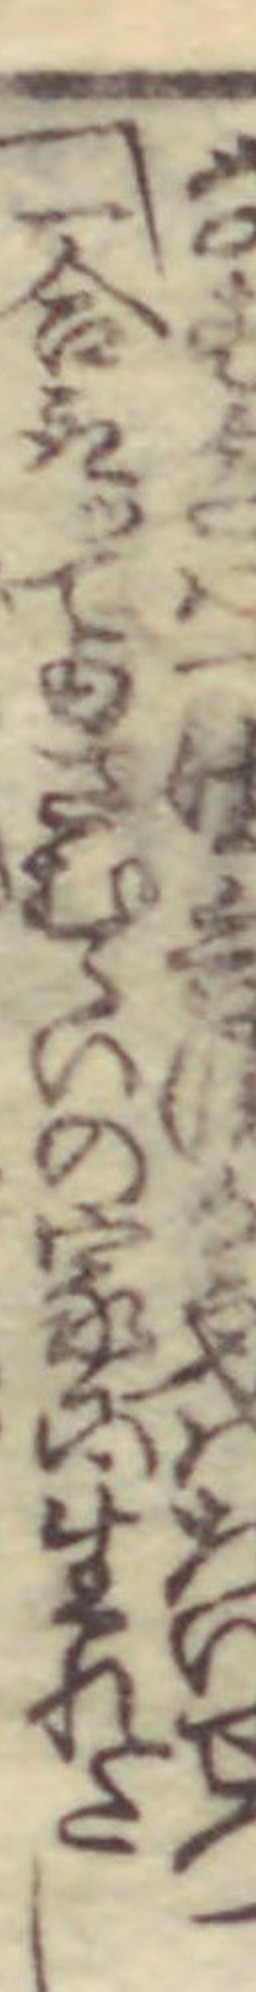〽一合取てもさむらいの家に生れた
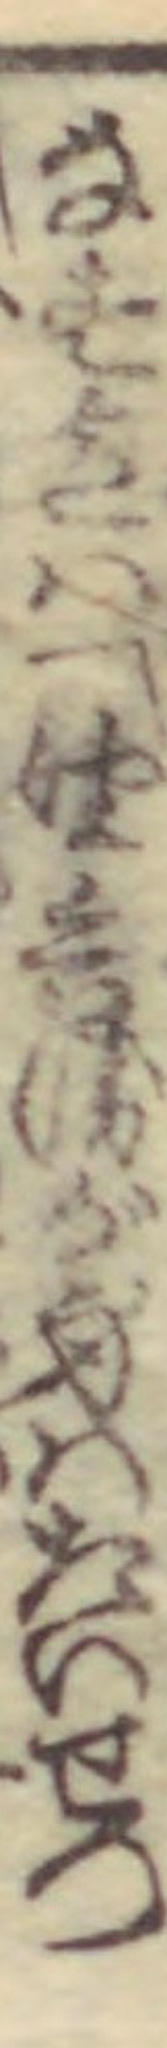なす与一は〽兵衛が身はたいせつ
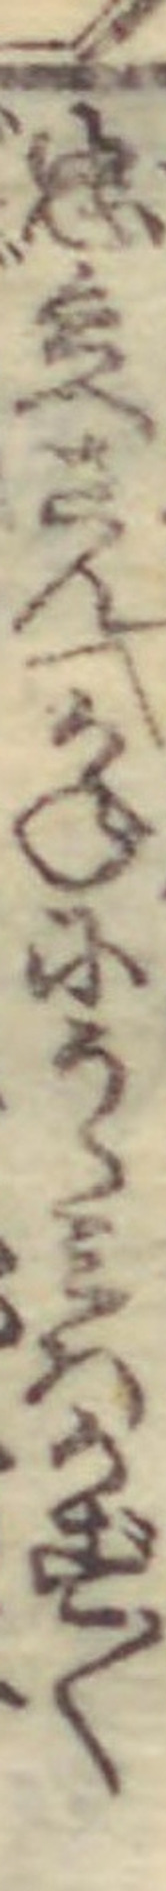忠兵へさん〽かねにうらみはかず〳〵
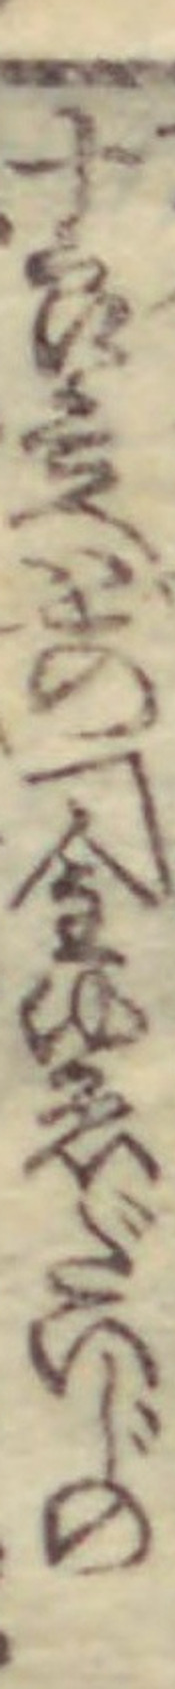十郎兵へとの〽金ゆゑだいじの
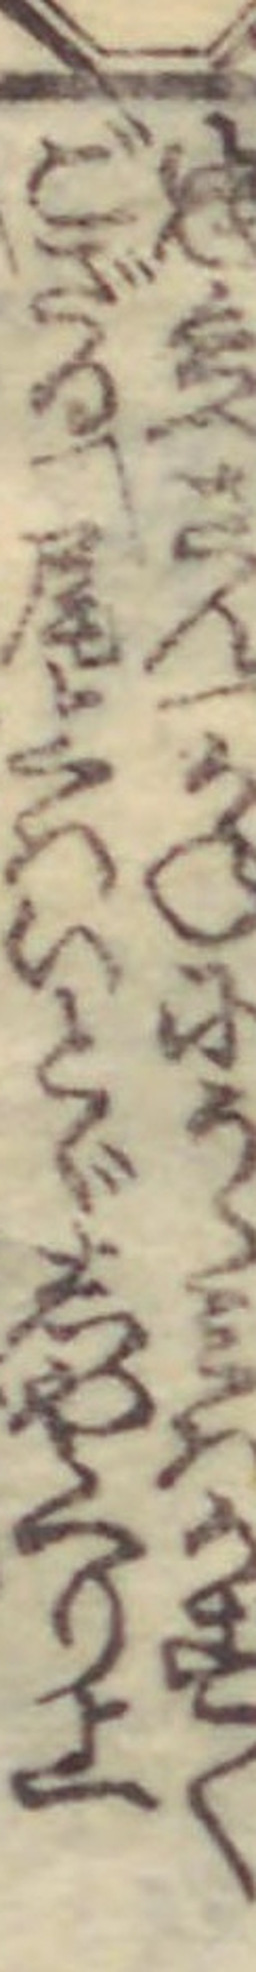ござる〽尾上はいとゞしやくり上
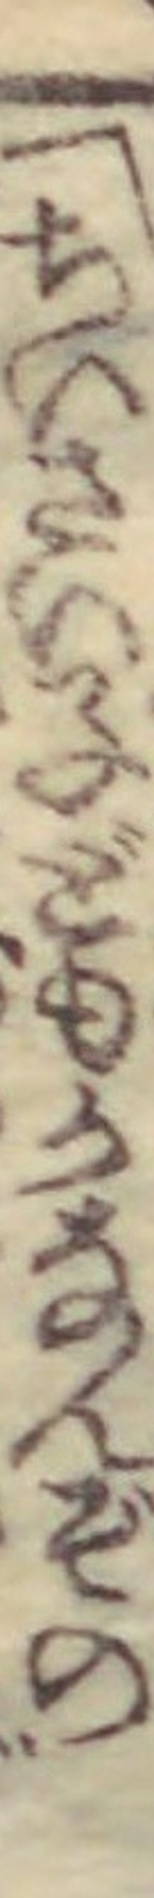〽ちいさな子どもかなんぞの
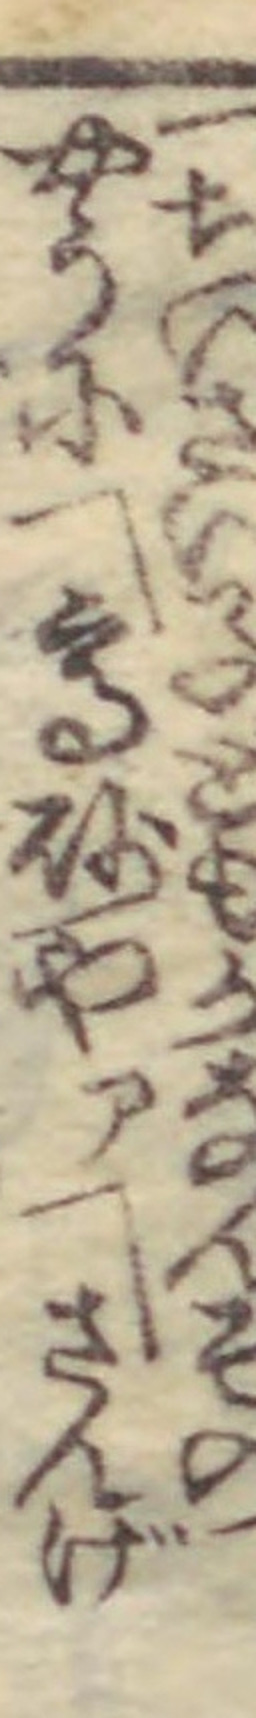やうに〽高砂やァ〽さんげ
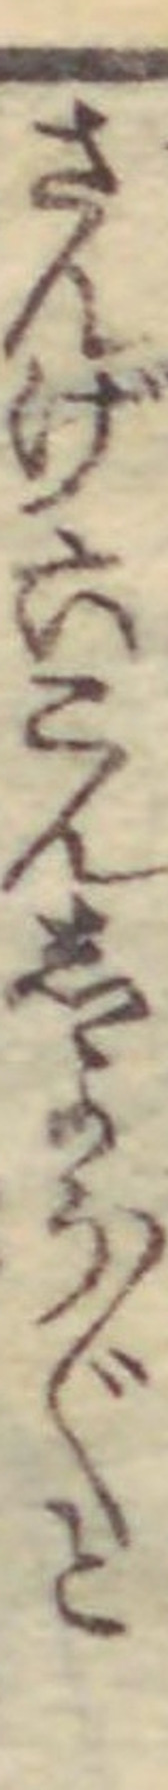さんげ六こんしよう〴〵と
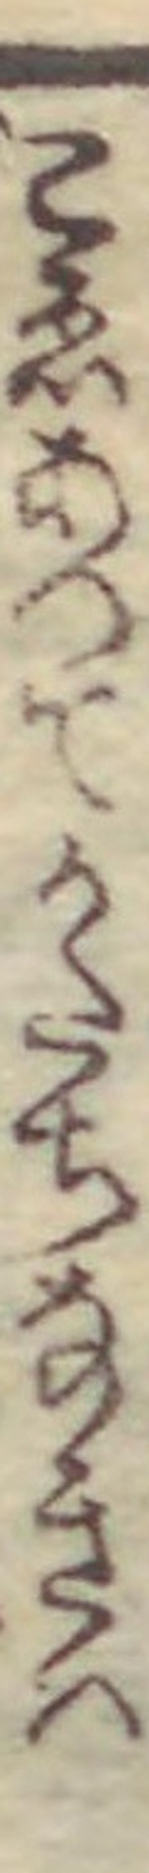こゑあつてかたちなきは
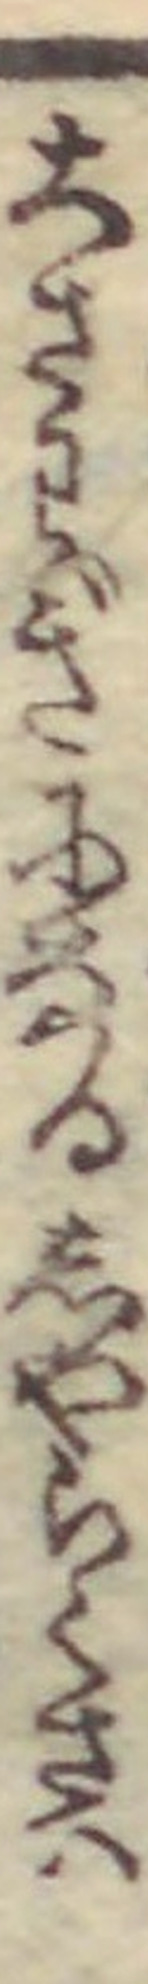大さわぎになるしやらくさい
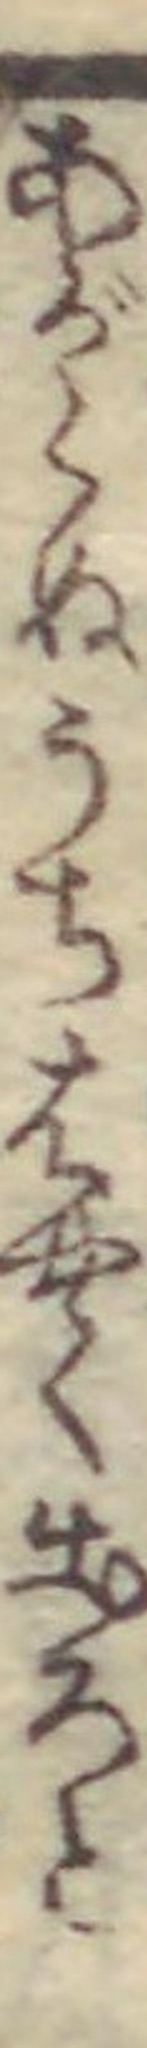あがらぬうちはやく出ろと
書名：大時代唐土化物 3巻. 曽我太夫染
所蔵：国立国会図書館 National Diet Library, JAPAN
